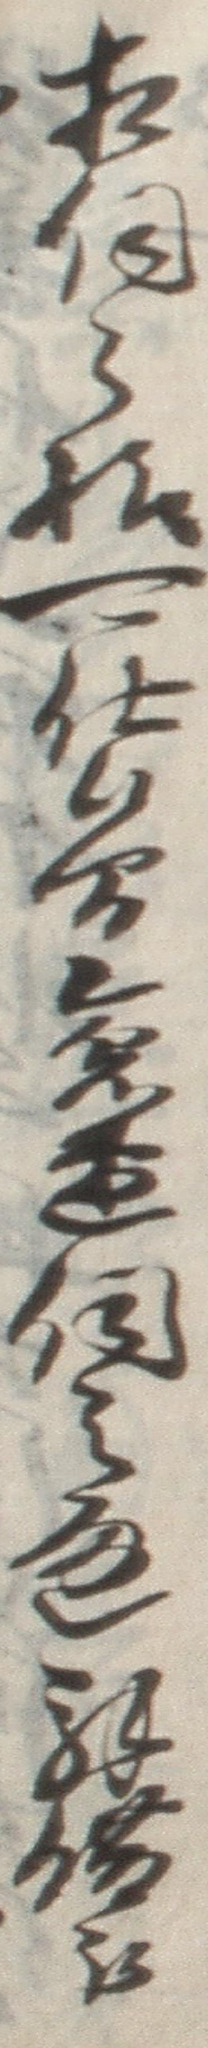相伺候様可仕候間急速伺之通拝借被
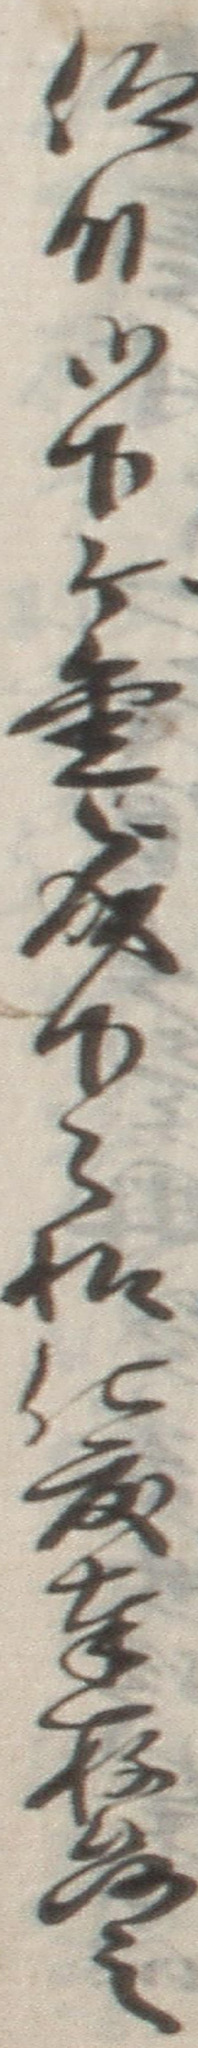仰付御下ヶ置被成下候様仕度奉存候仍之

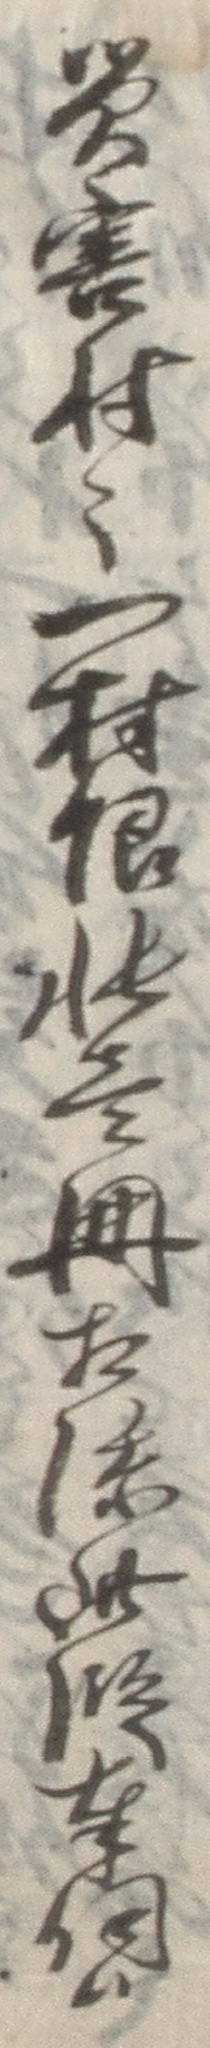災害村々之一村限帳壱冊相添此段奉伺候
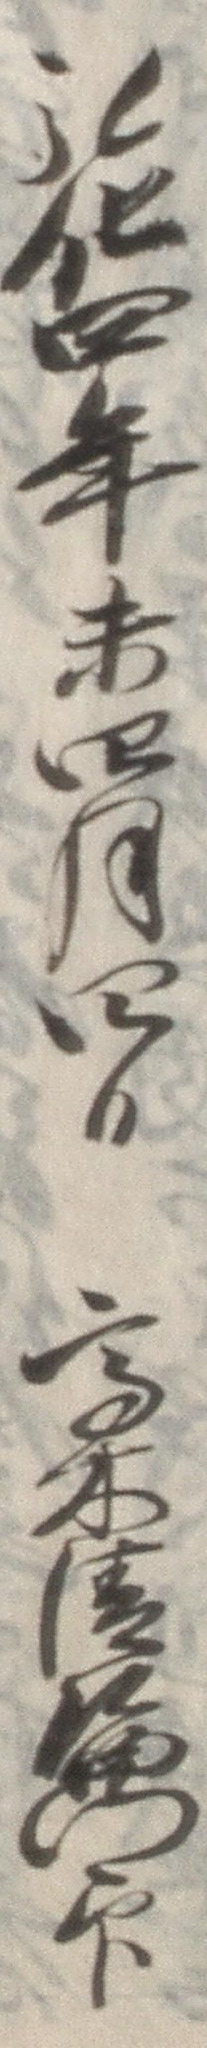弘化四年未四月四日高木清左衛門
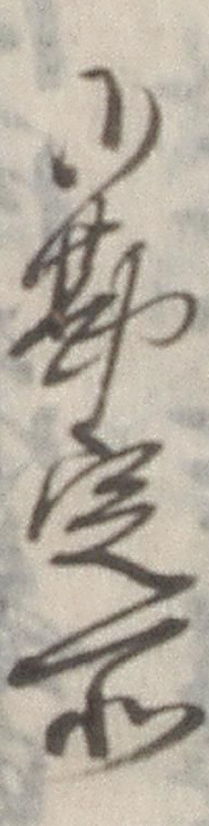御勘定所
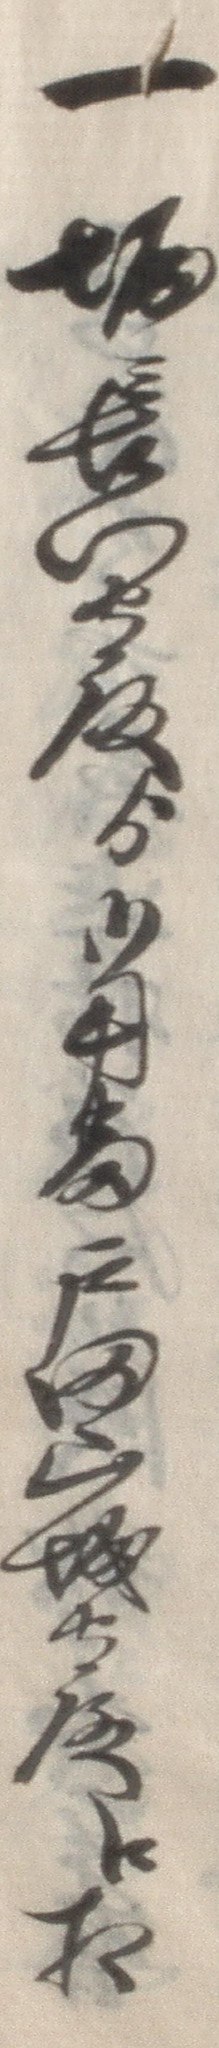一堀長門守殿ゟ御用番小田山城守殿江相
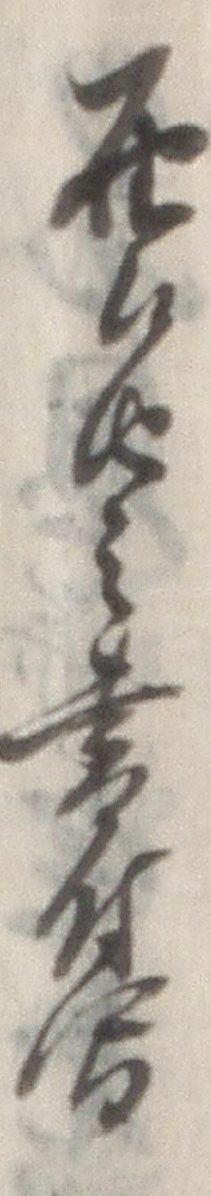届候由之書付写
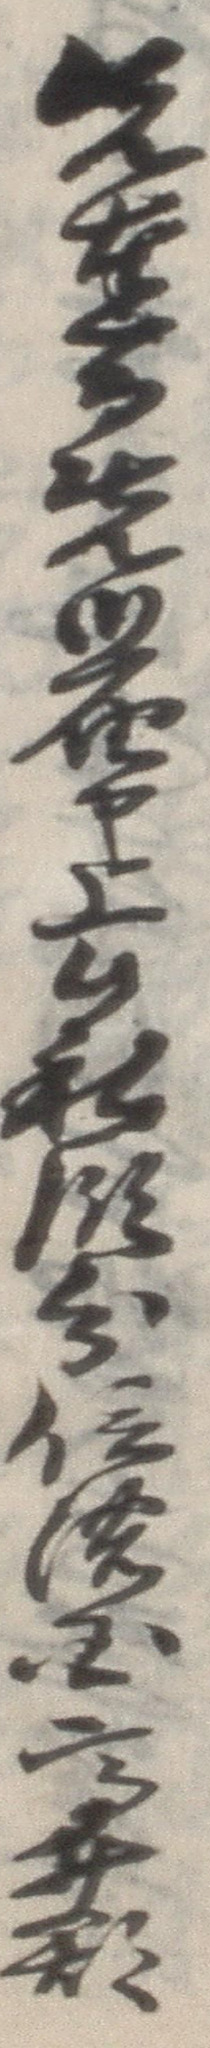先達而先御届申上候私領分信濃国高井郡
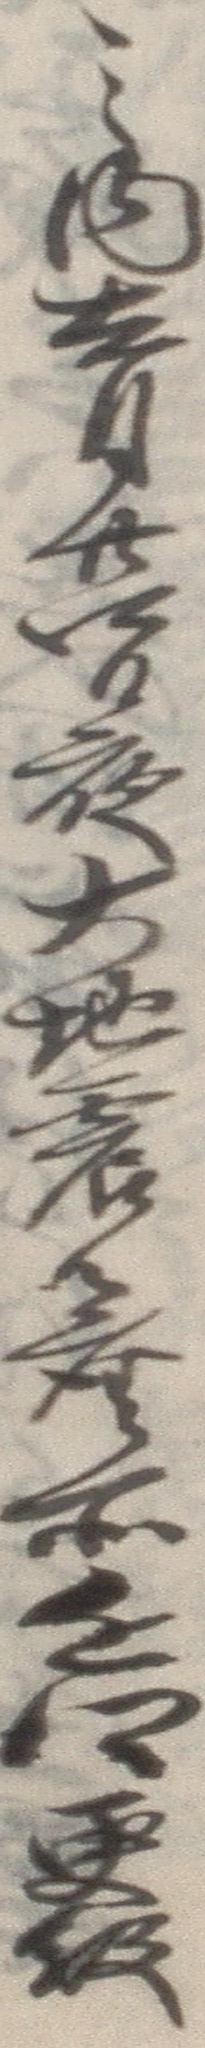之内去月廿四日夜大地震御座候所近郷更級
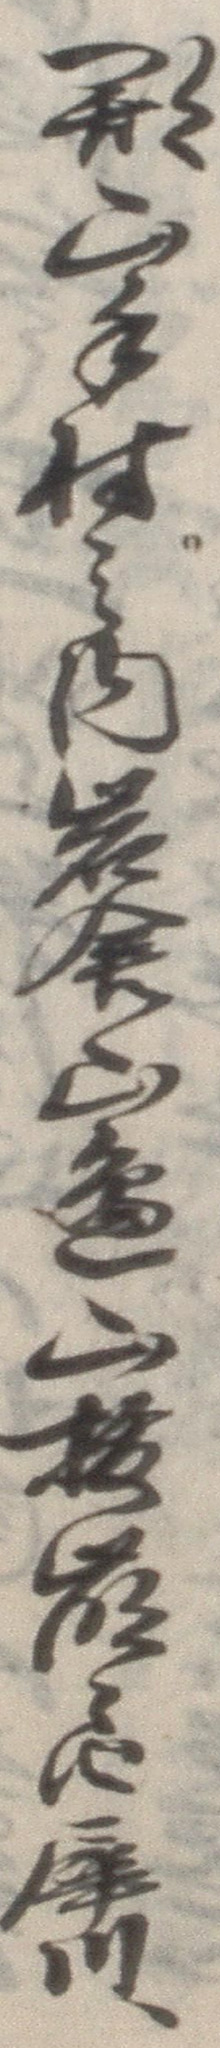郡山手村々之内岩倉山辺山抜崩候由犀川へ
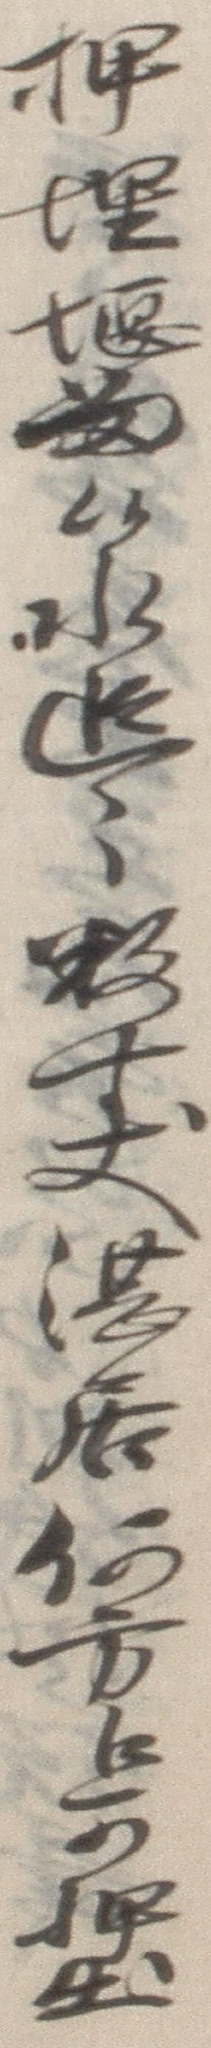押埋堰留候水追々数十丈湛居何方江可押出
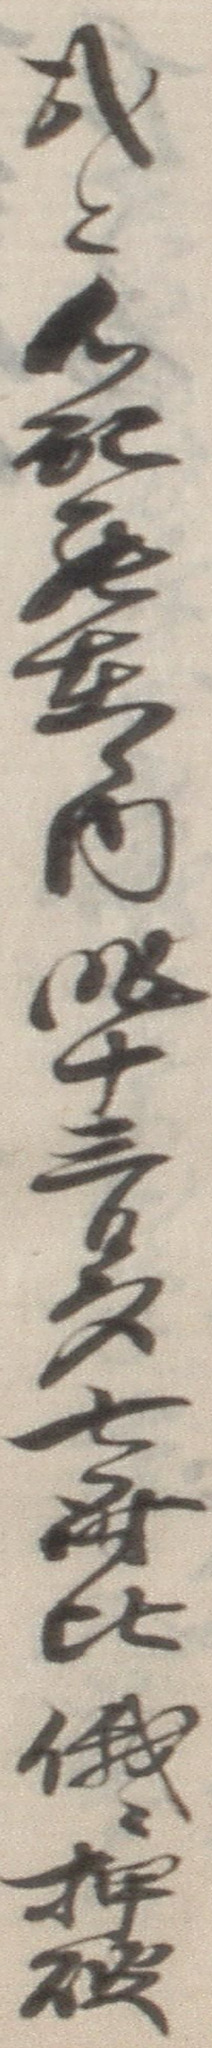哉と心配罷在候内昨十三日夕七時比俄二押破
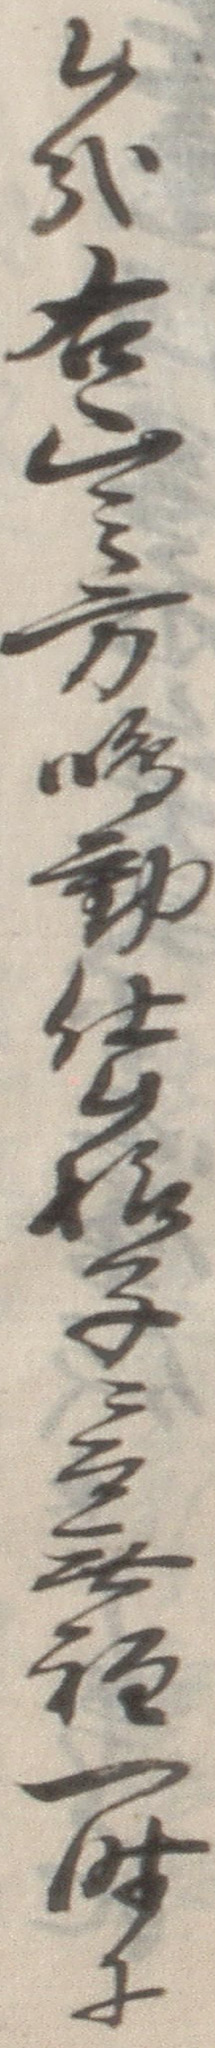候哉右山之方鳴動仕候様子二而無程一時に
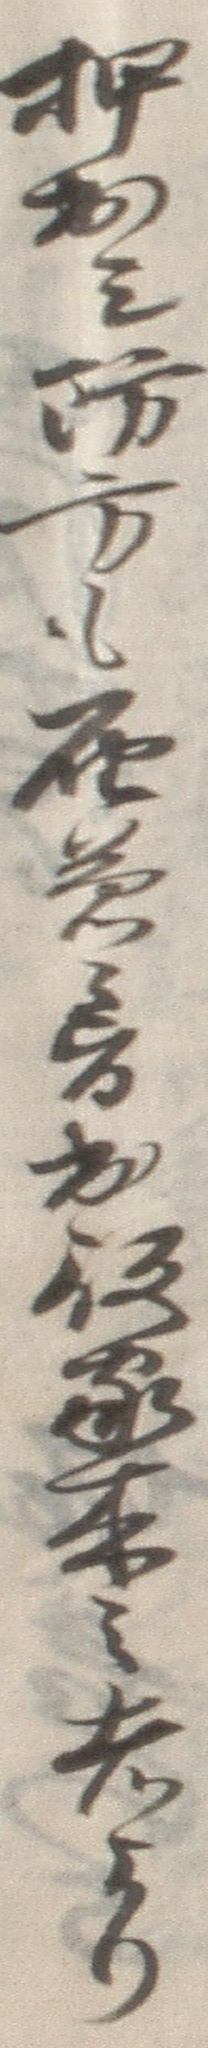押出シ防方も届兼候旨出役家来之者共より
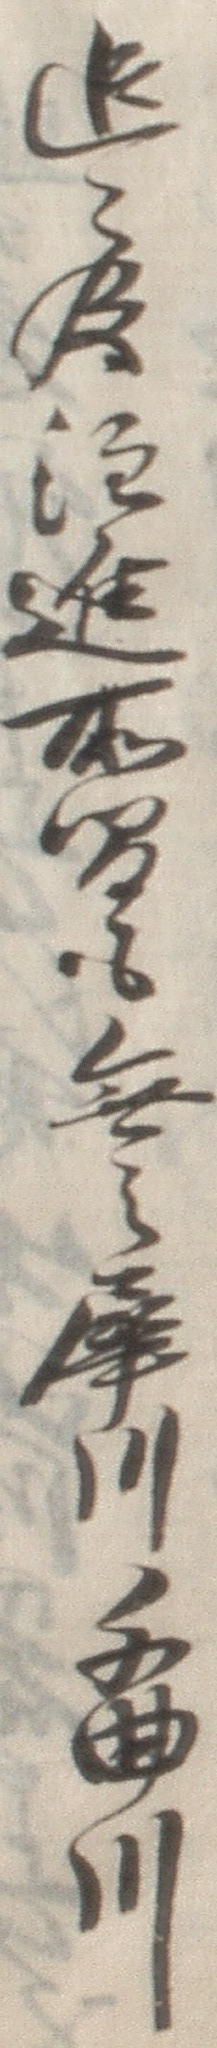追々及注進所間も無之犀川千曲川
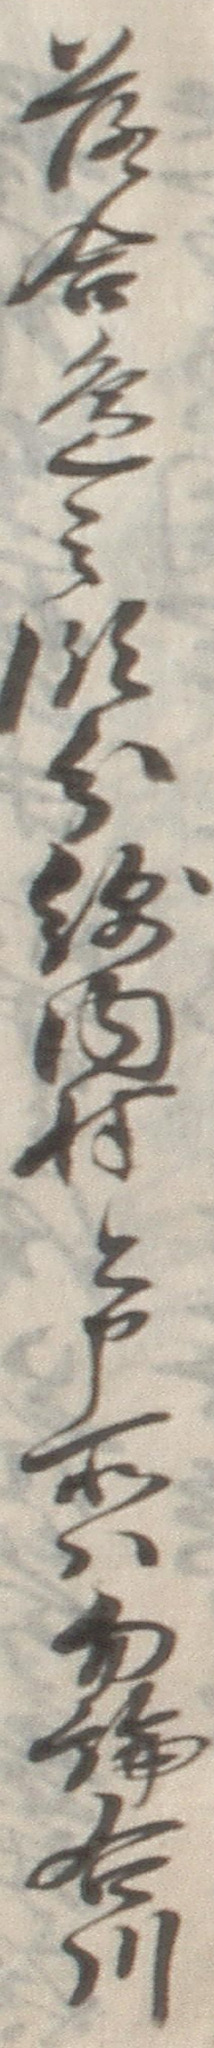落合辺之領分綿内村と申所ハ勿論右川
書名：信州地震一件
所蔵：東京大学地震研究所図書室 Earthquake Research Institute Library, The University of Tokyo, JAPAN
